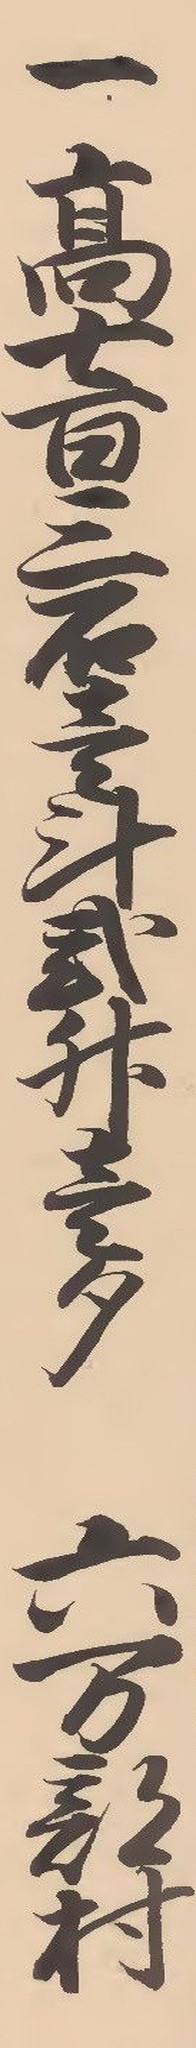一高七百三石壱斗弐升壱勺六万部村
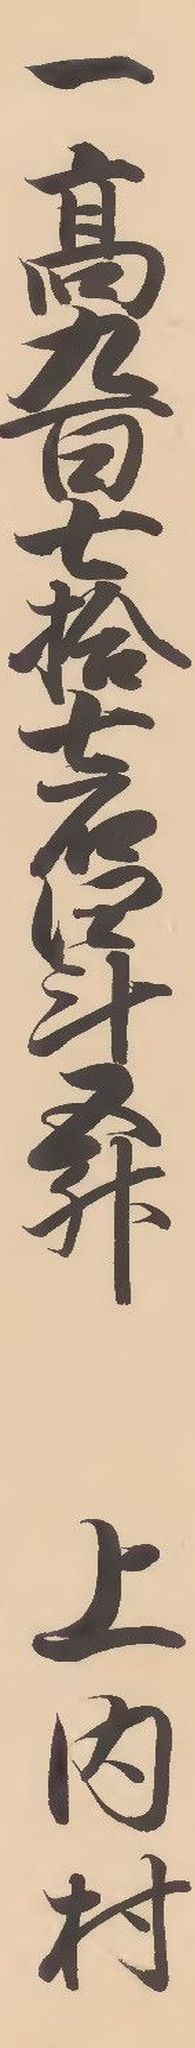一高九百七拾七石四斗五升上内村
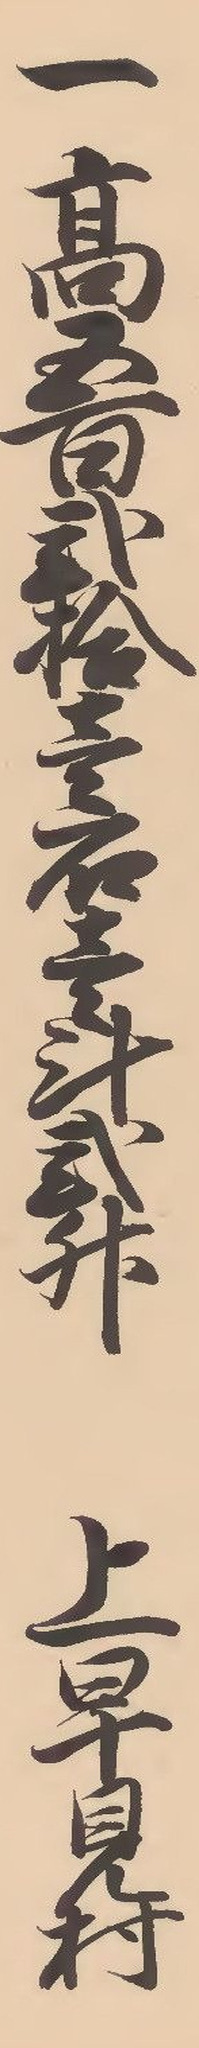一高五百弐拾壱石壱斗弐升上早見村
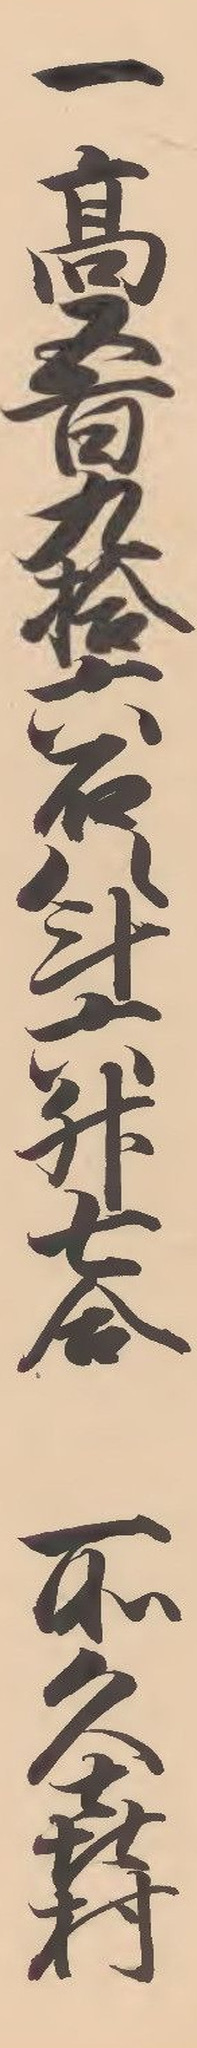一高五百九拾六石八斗六升七合所久喜村

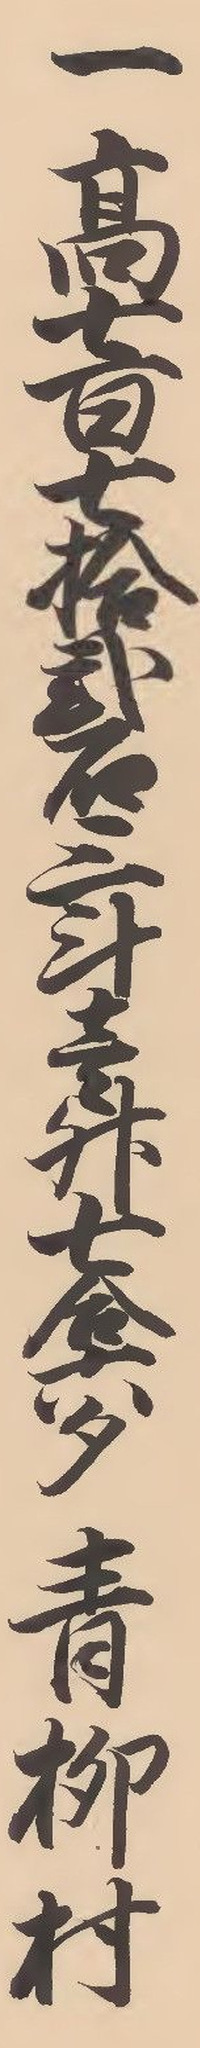一高七百七拾弐石三斗壱升七合六勺青柳村
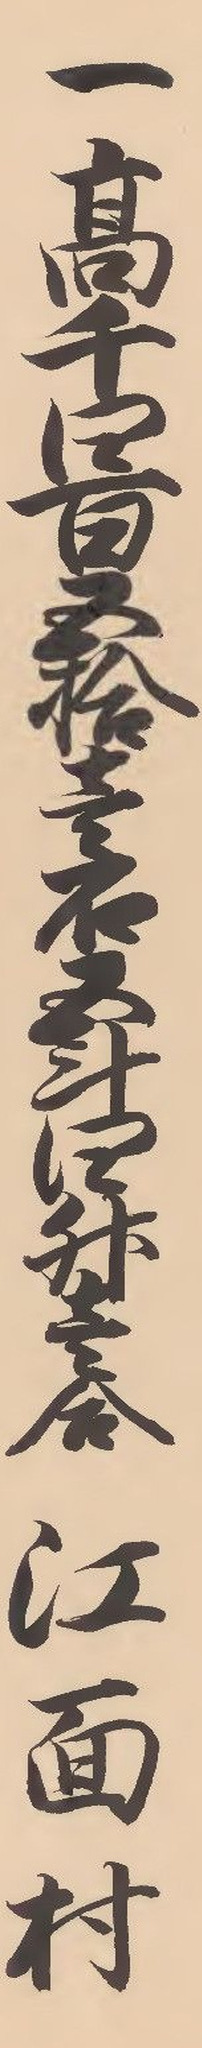一高千四百五拾壱石五斗四升壱合江面村
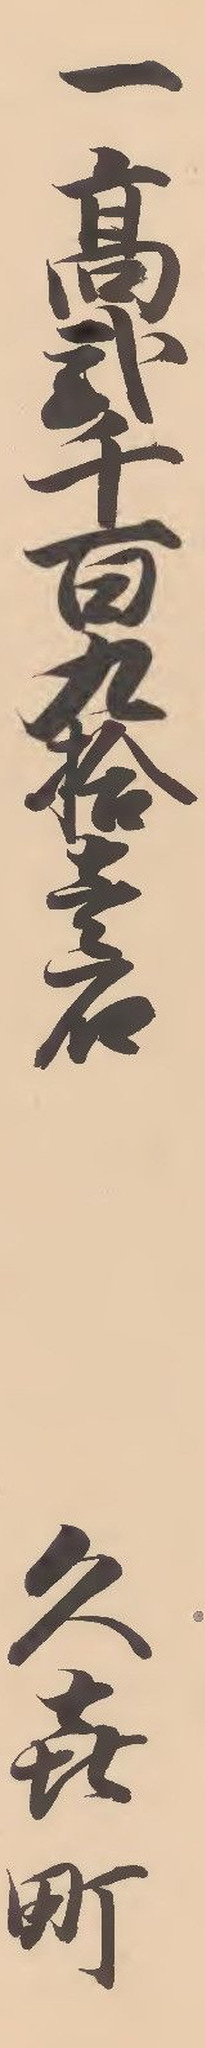一高弐千百九拾壱石久喜町
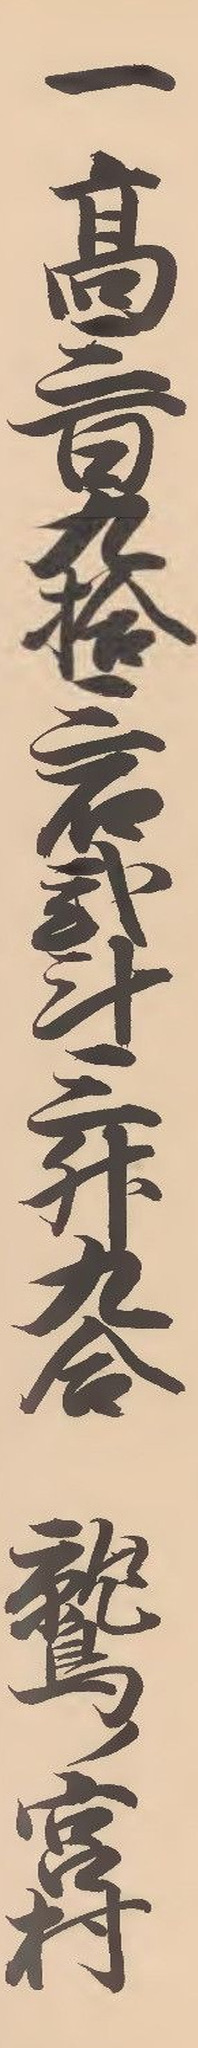一高三百九拾三石弐斗三升九合鷲ノ宮村
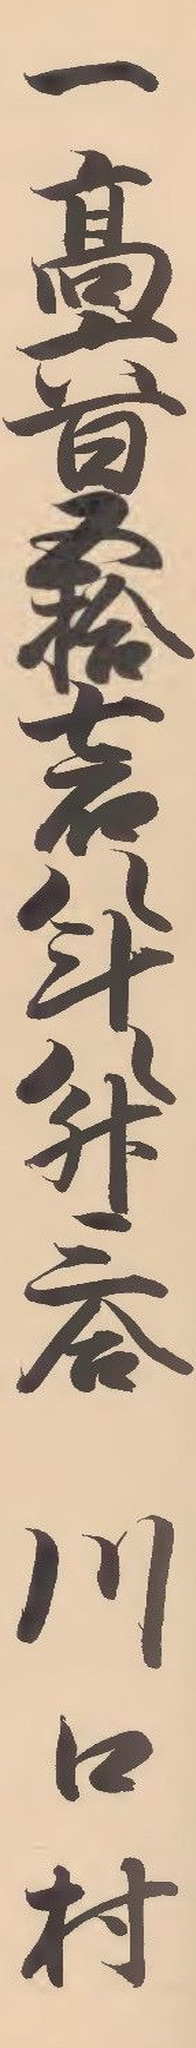一高六百五拾七石八斗八升三合川口村
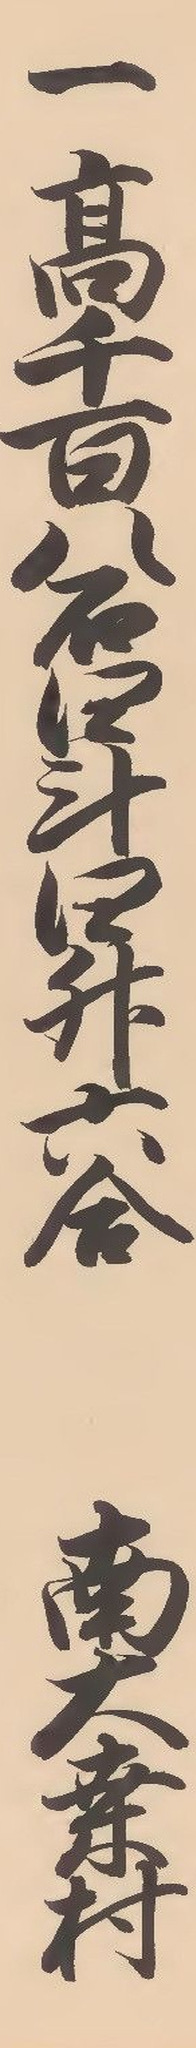一高千百八石四斗四升六合南大桑村
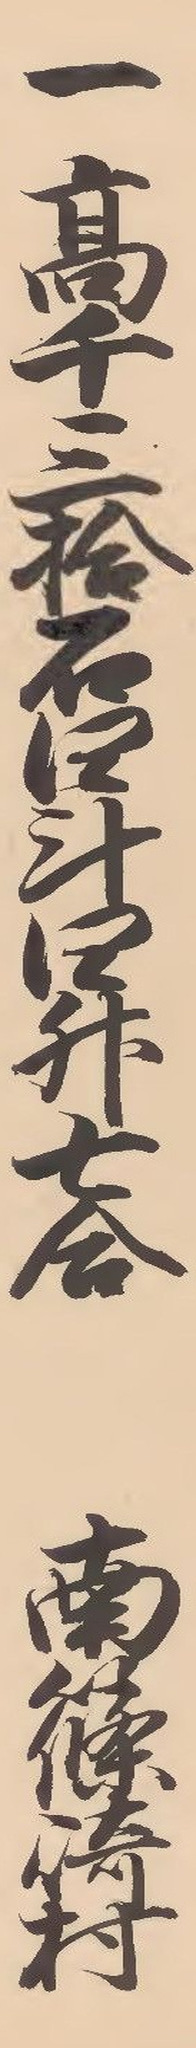一高千三拾石四斗四升七合南篠崎村
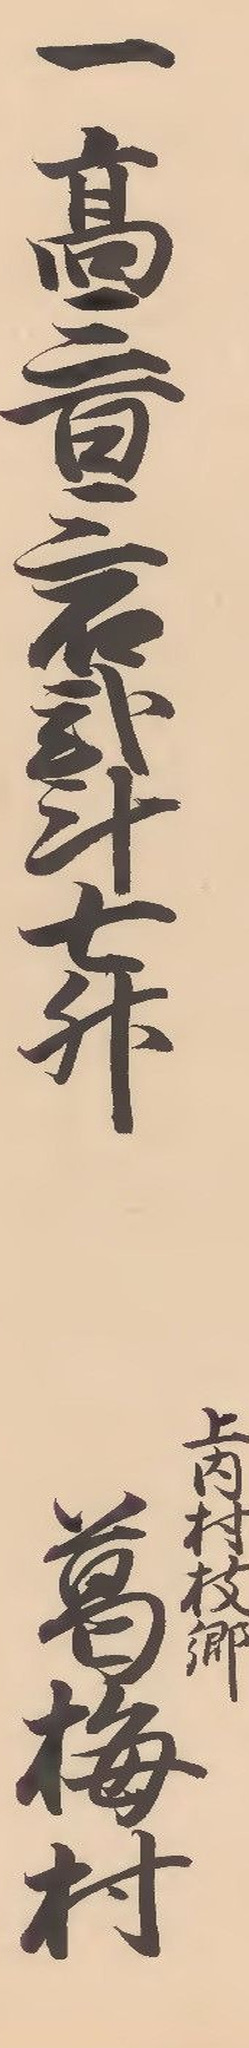一高三百三石弐斗七升葛梅村

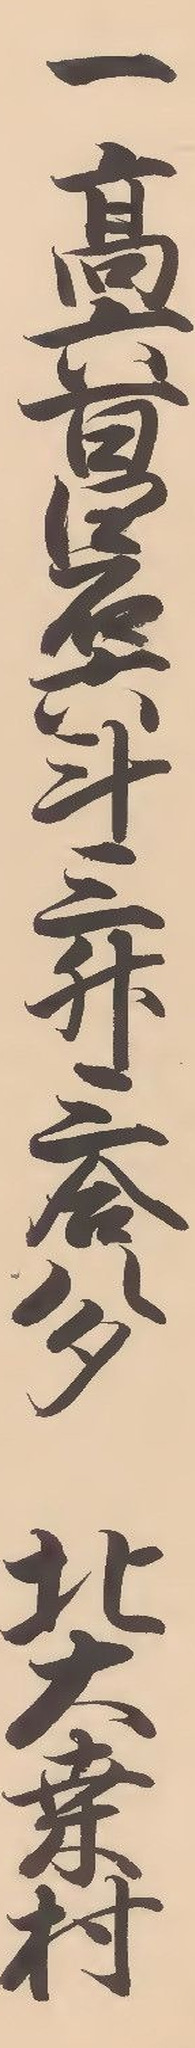一高六百四石六斗三升三合八勺北大桑村
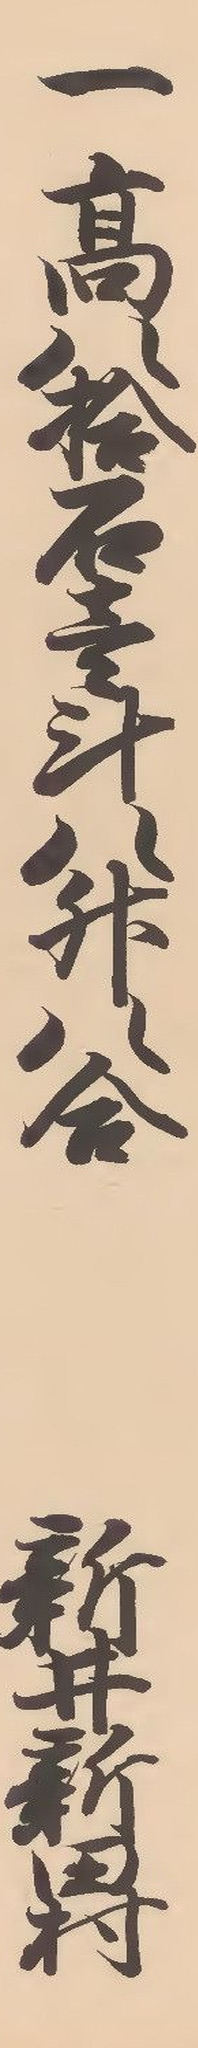一高八拾石壱斗八升八合新井新村田
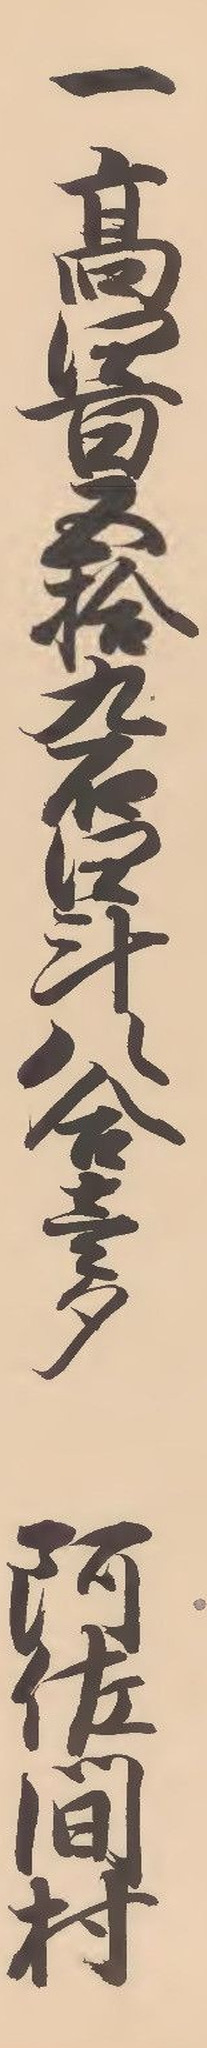一高四百五拾九石四斗八合壱勺阿佐間村
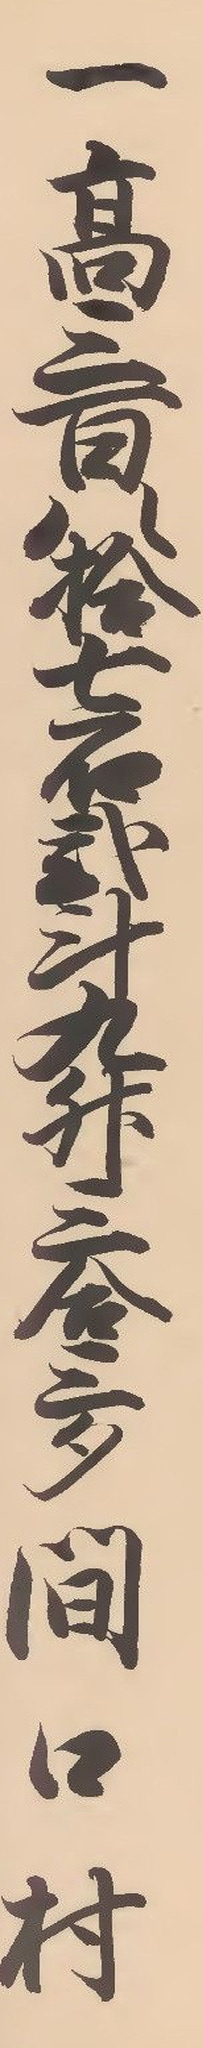一高三百八拾七石弐斗九升三合三勺間口村
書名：武蔵国郷帳　下
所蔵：国立公文書館 National Archives of Japan
